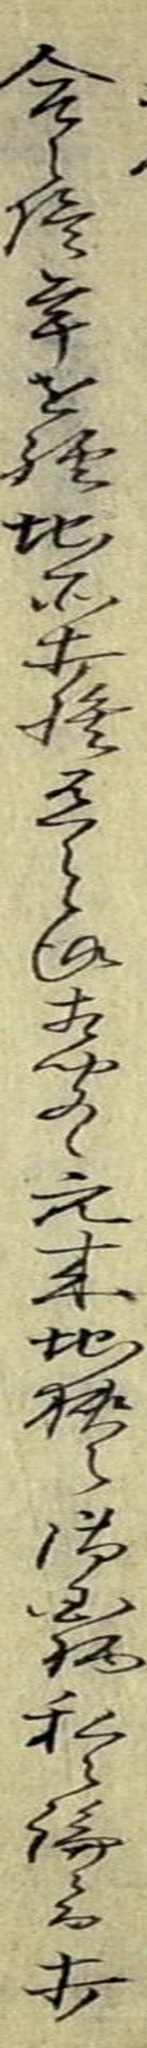合之侭に年を経地所打捨有之趣相聞候元来地狭之御国柄私之論に而打
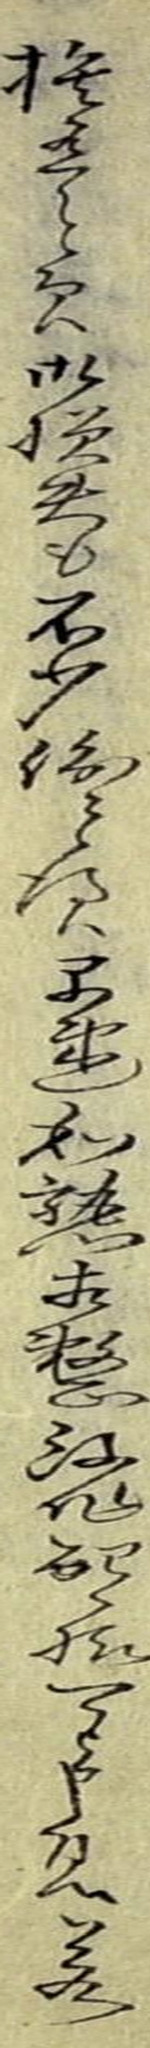捨有之候而は御損失も不少儀に候へは早速和熟相整致作配候様可被申付候若
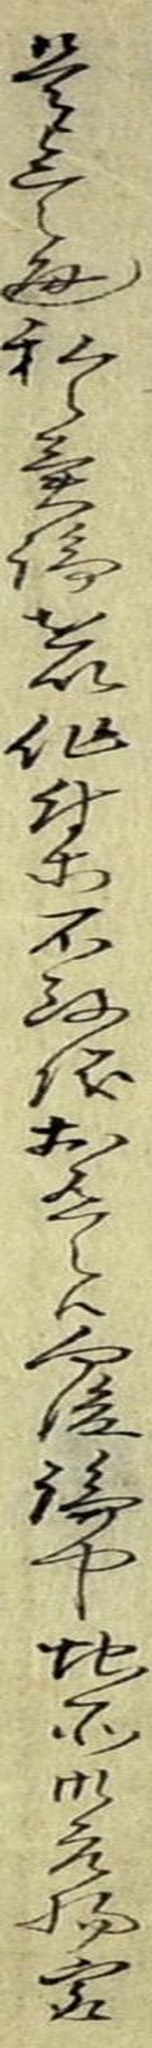是迄之通私之異論を以作付等不致儀於有之は向後論中地所御取揚最
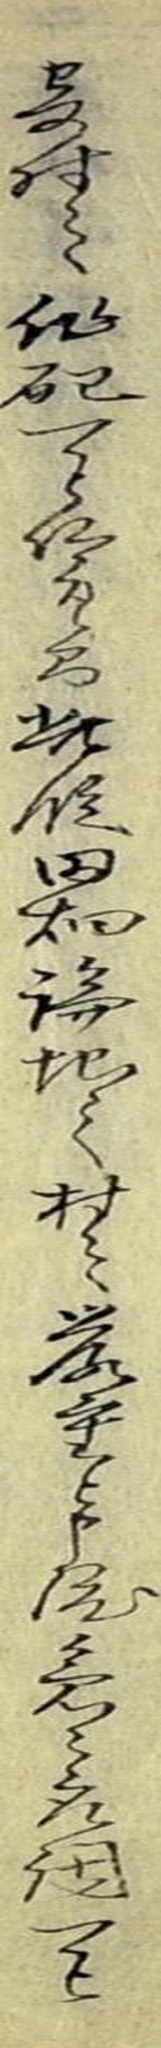寄村々へ作配可被仰付候間此段田畑論地之村々へ厳重被申渡急々取調可被
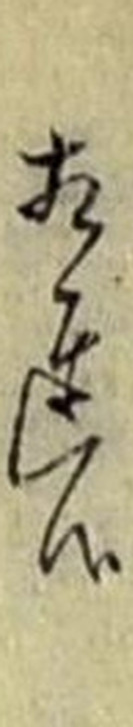相達候
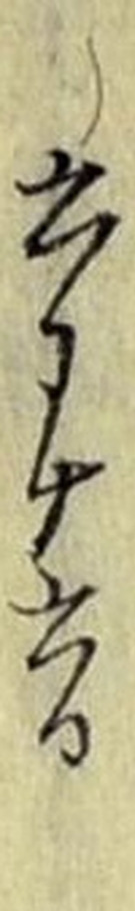六月十六日
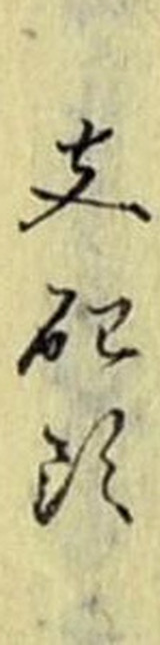支配頭

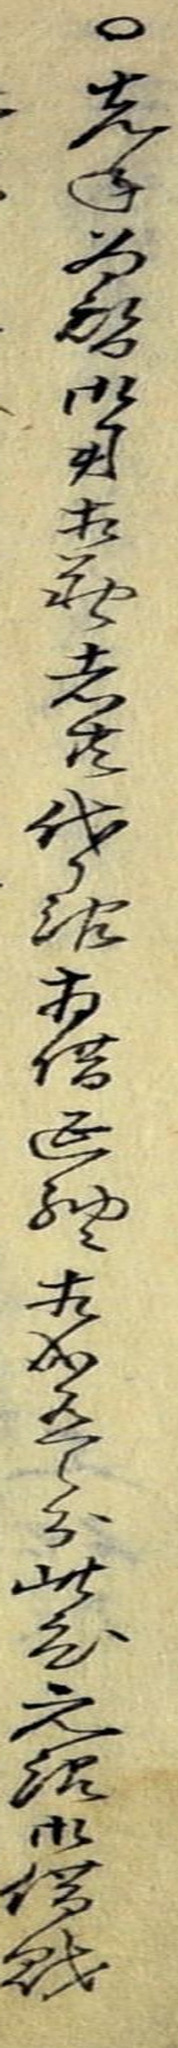○先年為替御用相勤候者共代り銀拝借延納に相成候分此度元銀御借財
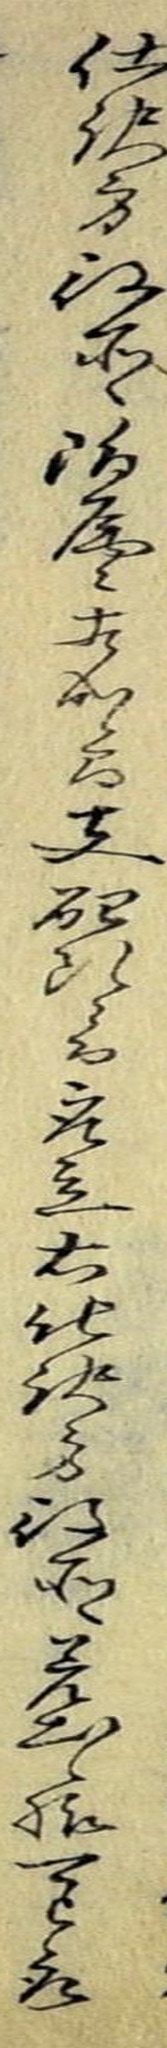仕訳方役所へ附属に相成候間支配頭に而取立右仕訳方役所へ差出候様可被取
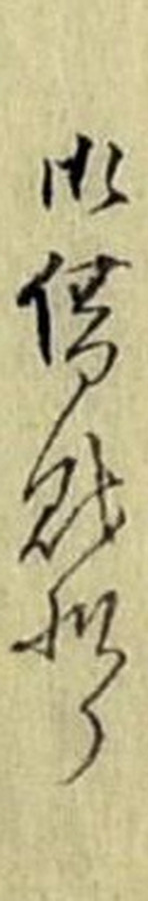御借財掛り
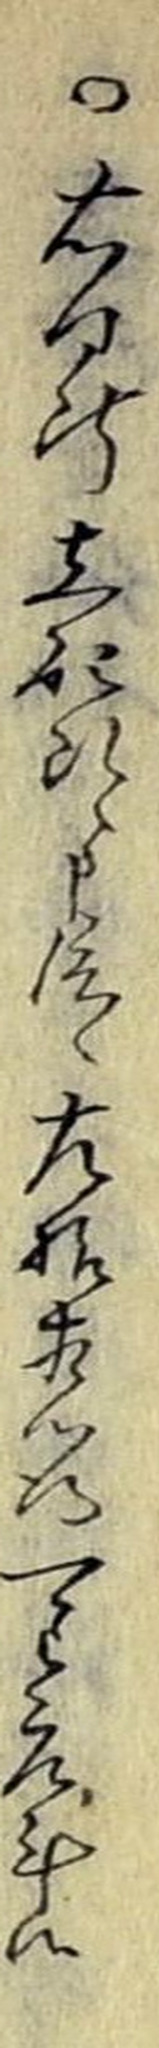○右同断支配頭へ申渡候左様相心得可被取斗候
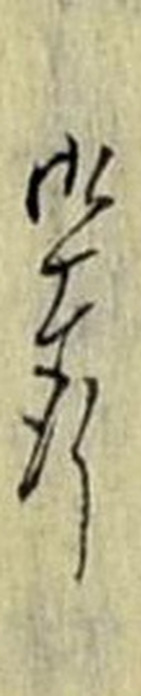御奉行
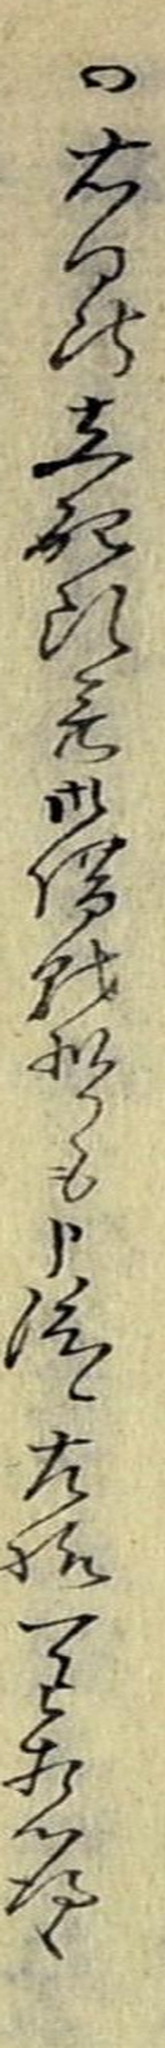○右同断支配頭井御借財掛りへも申渡候左様可被相心得候
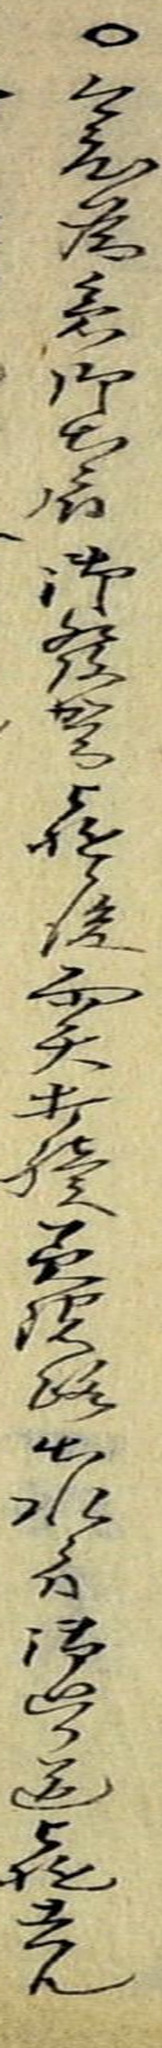○今度為急御出府御発駕被遊候後雨天打続美濃路出水に付御廻り道被遊去ル
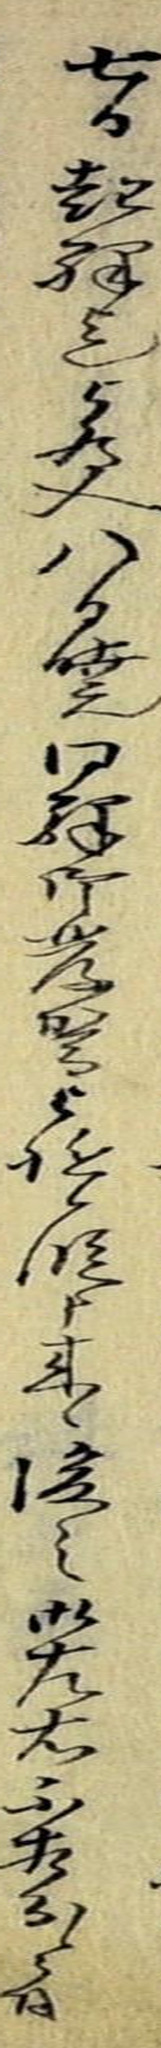七日起駅迄被為入八日暁同駅御発駕被遊候段申来候後之御左右不相分候に付
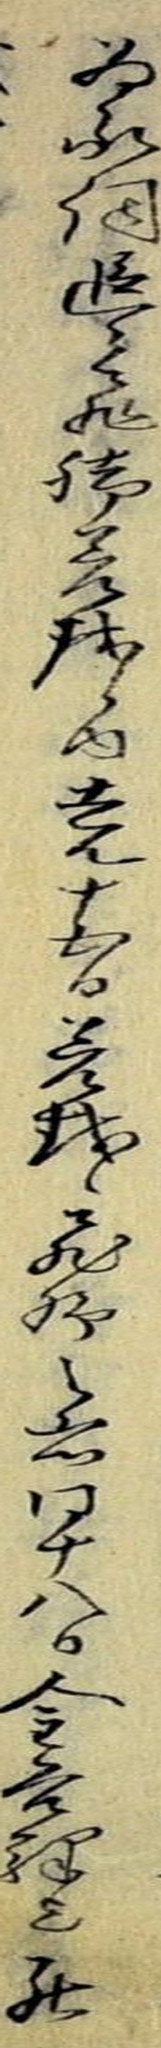為承調追々に飛脚差越候内去ル十五日差越候飛脚之者同十八日金谷駅迄罷
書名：命令之部 六
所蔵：福井県文書館 Fukui Prefectural Archives
